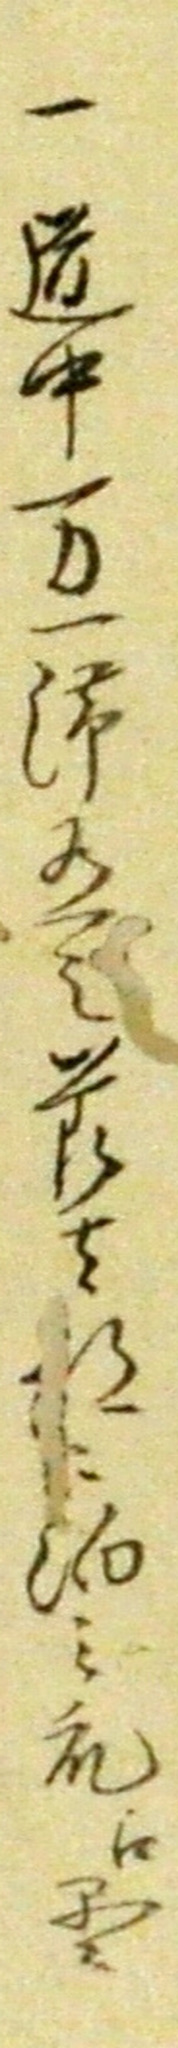一道中万一滞有之節は泊之衆江早々
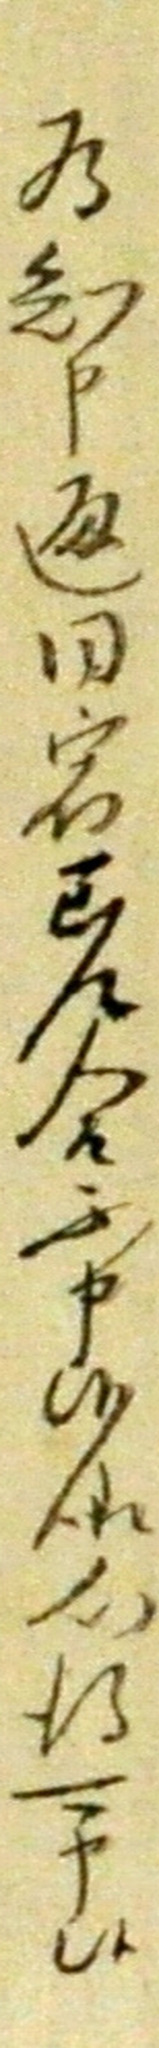為知申通同宿差合不申候様心得可申候
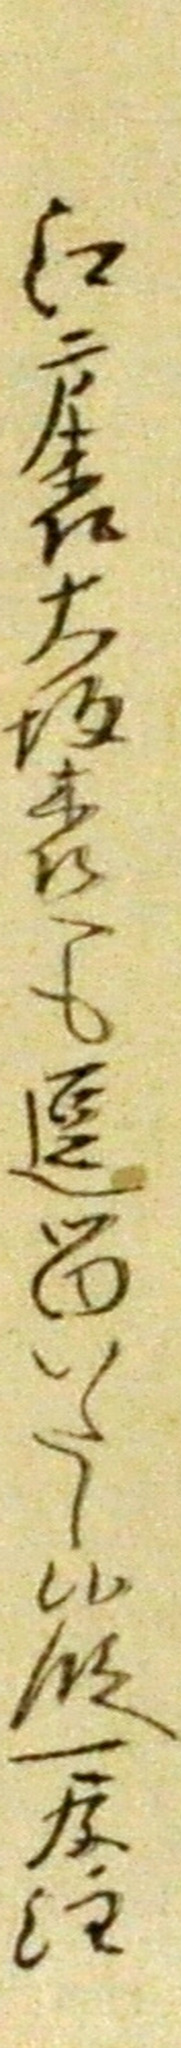江戸表大坂表へも逗留いたし候段可及注
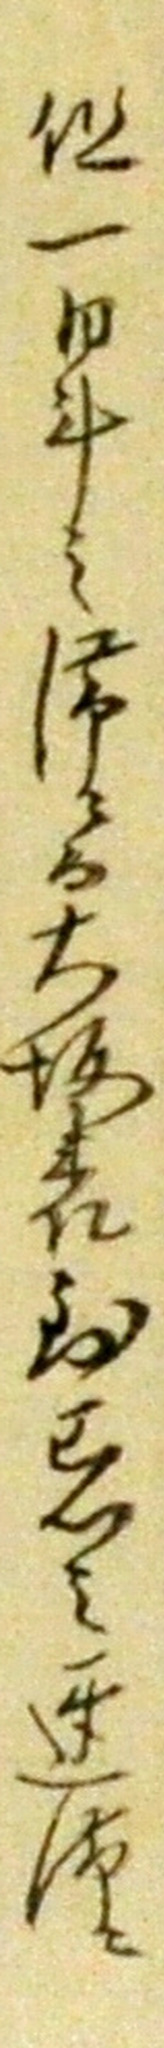但一日計之滞に而大坂表到着は遅滞ニ
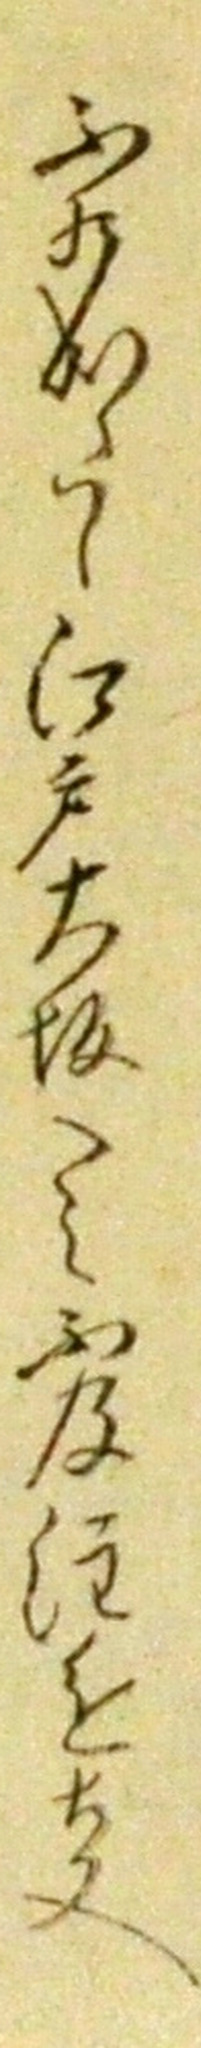不相成候はゝ江戸大坂へは不及注進事
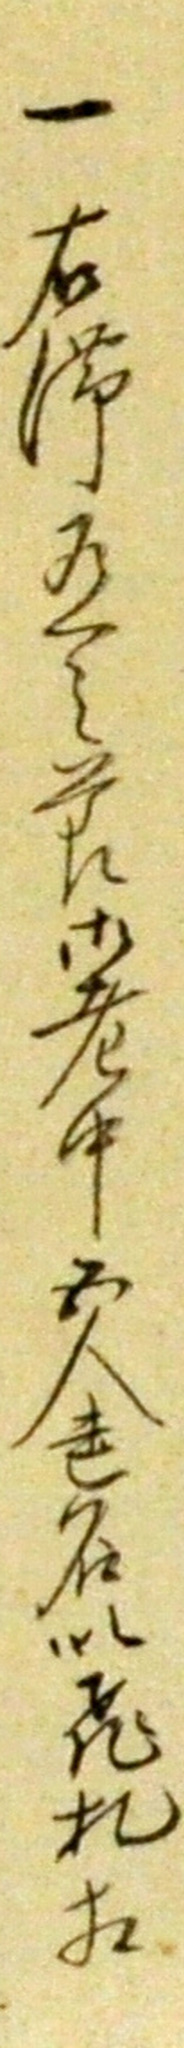一右滞有之節御老中五人連名以飛札相
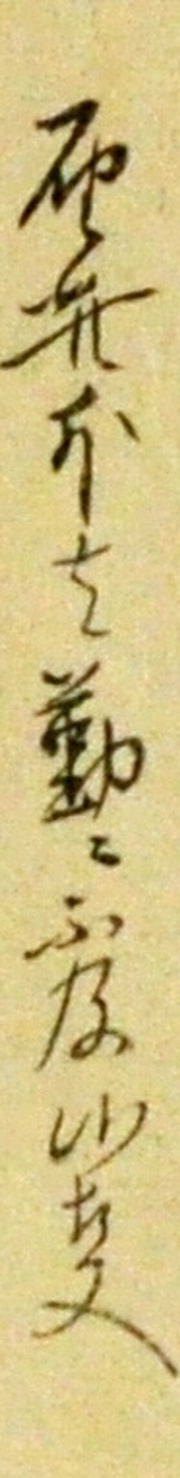届此外は勤に不及候事
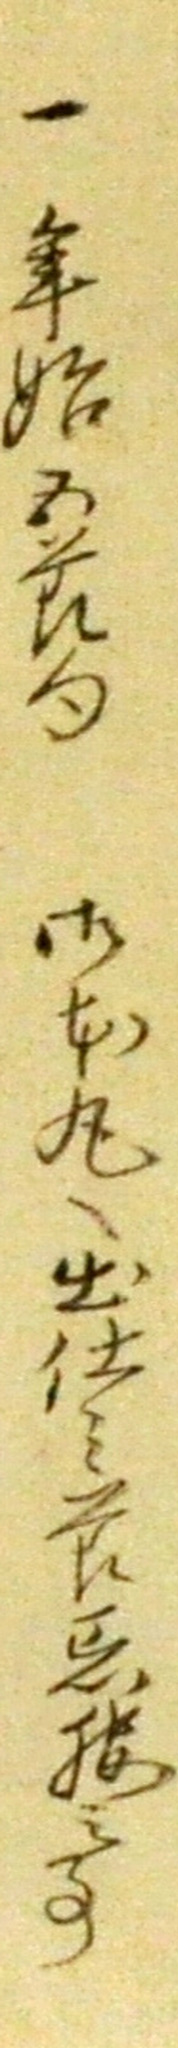一年始五節句御本丸へ出仕之節着服之事
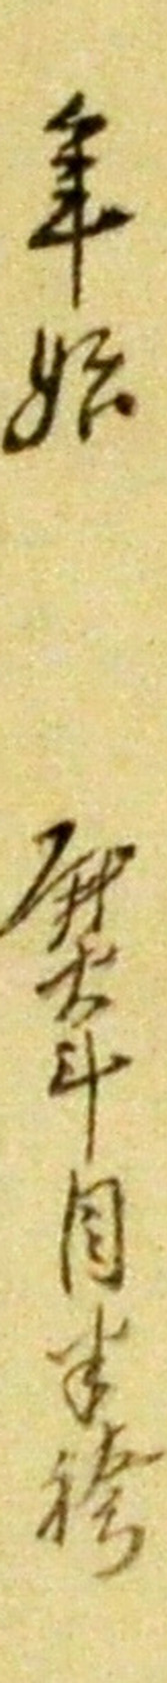年始熨斗目半袴
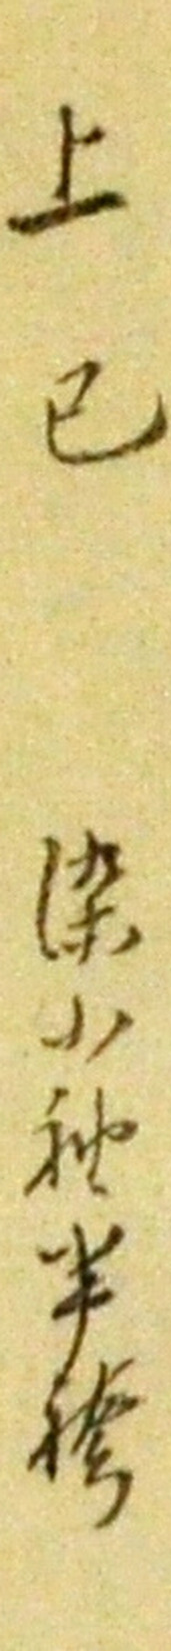上已染小袖半袴
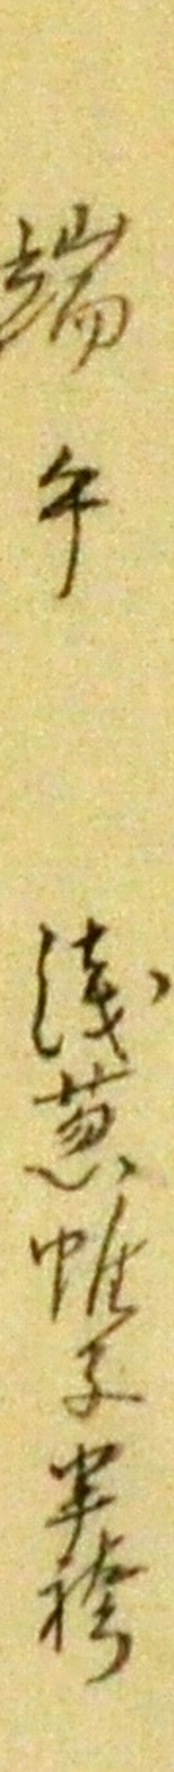端午浅葱帷子半袴
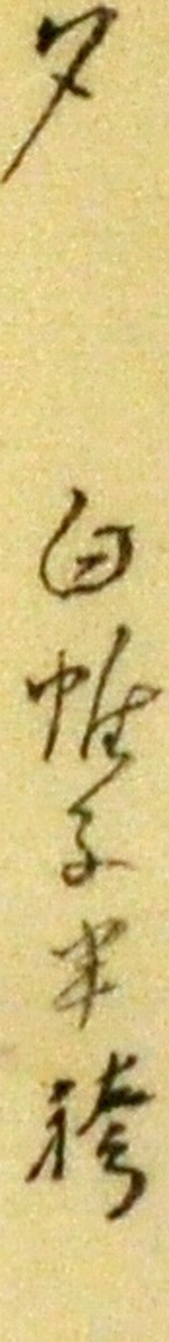七夕白帷子半袴
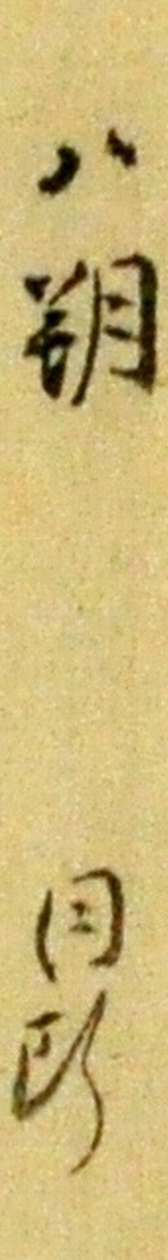八朔同断
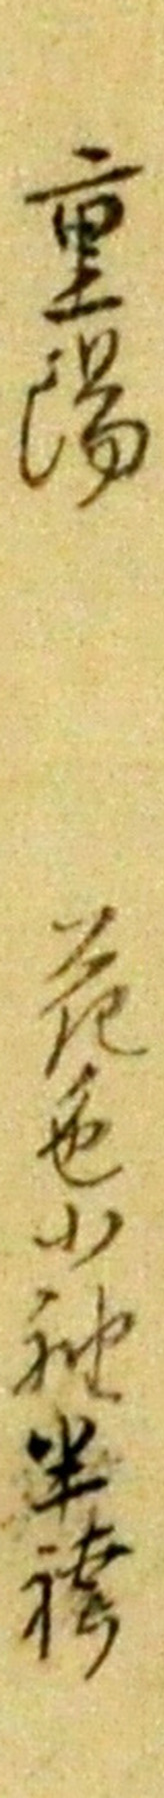重陽花色小袖半袴
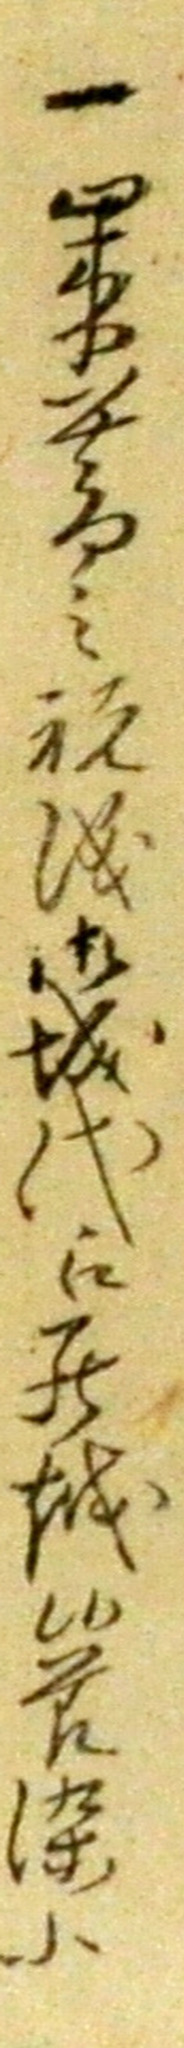一歳暮之祝儀御城代え罷越候節染小
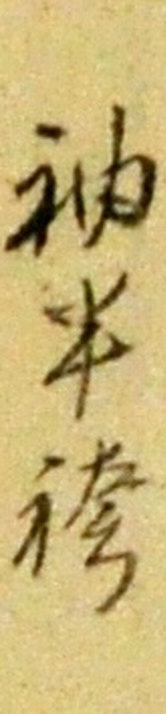袖半袴
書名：大阪加番関係諸書留〔一括〕
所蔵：伊那市立高遠町図書館・合同会社AMANE
